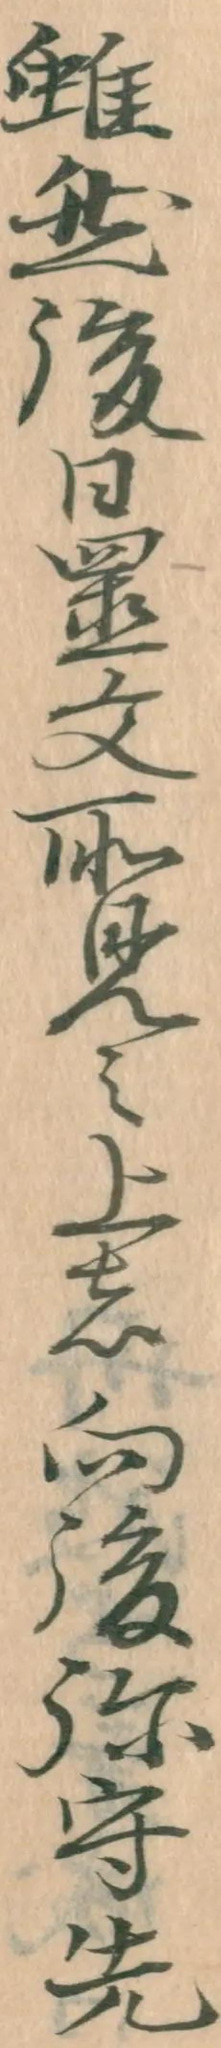雖然後日置文所見之上者向後弥守先
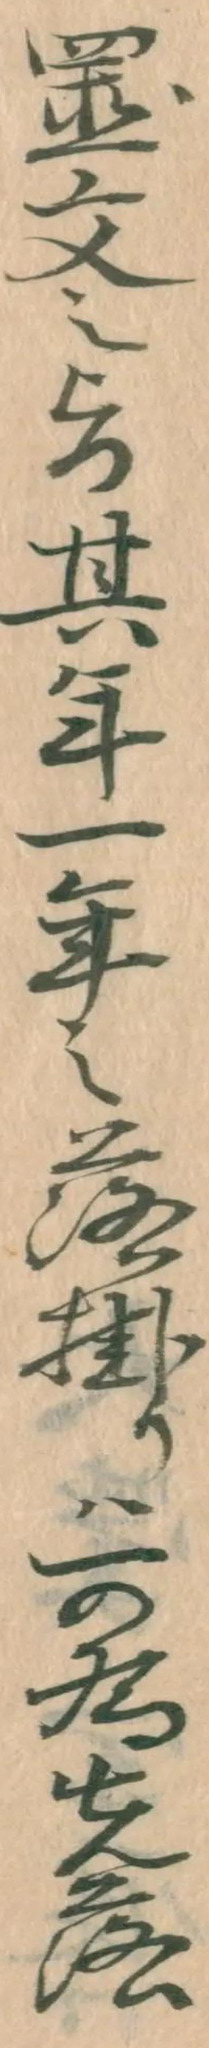置文之旨其年一年之落掛リハ可為先落
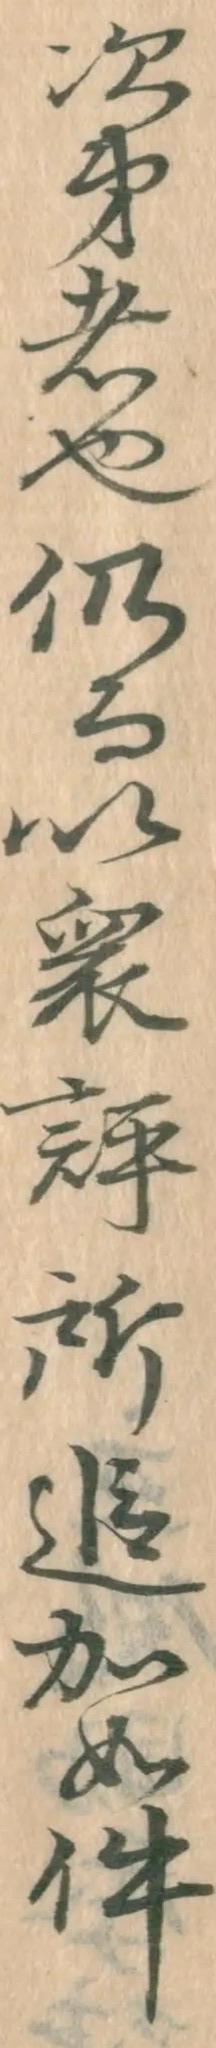次第者也仍而以衆評所追加如件
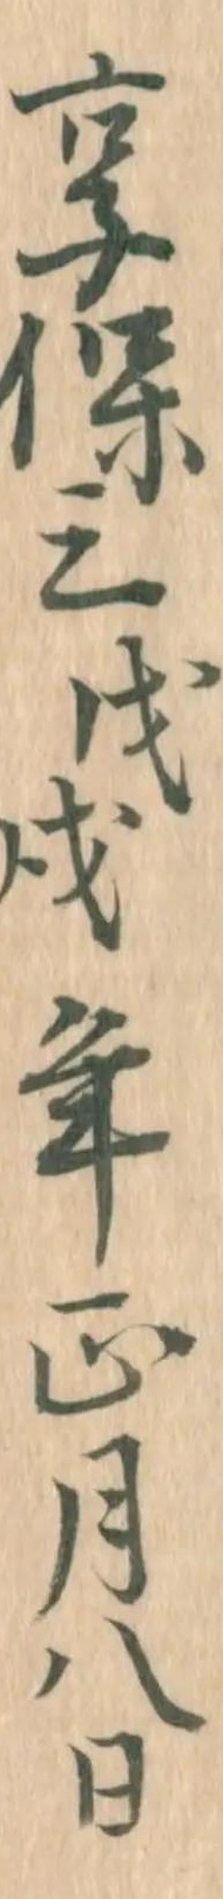享保三戊戌年正月八日
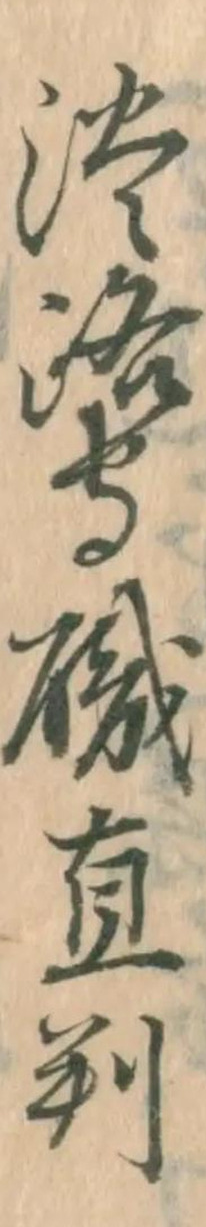淡路守職直判

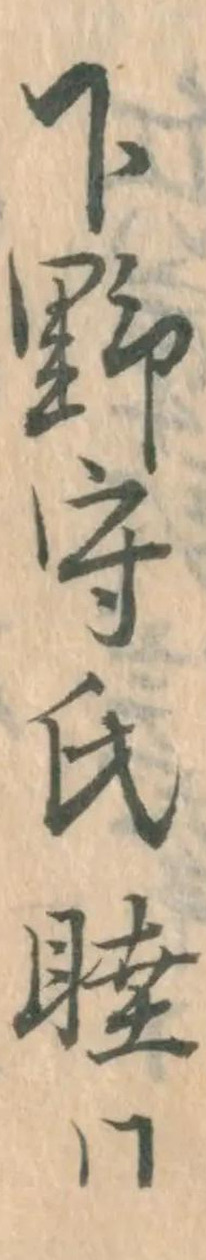下野守氏睦同
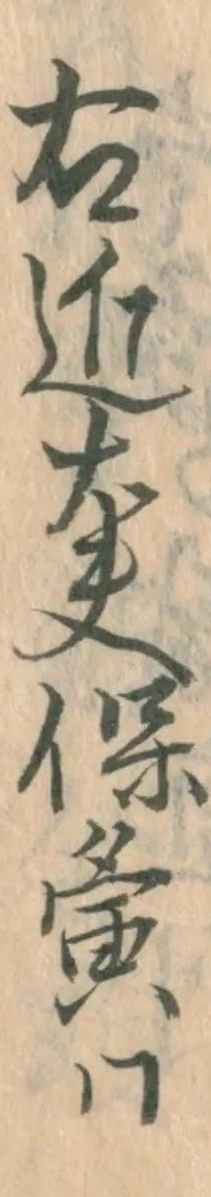右近大夫保夤同
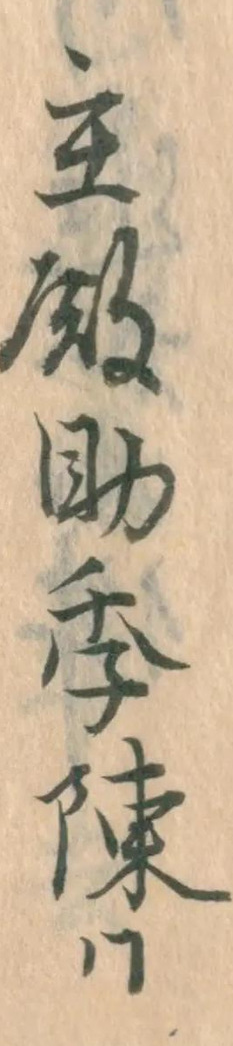主殿助季陳同
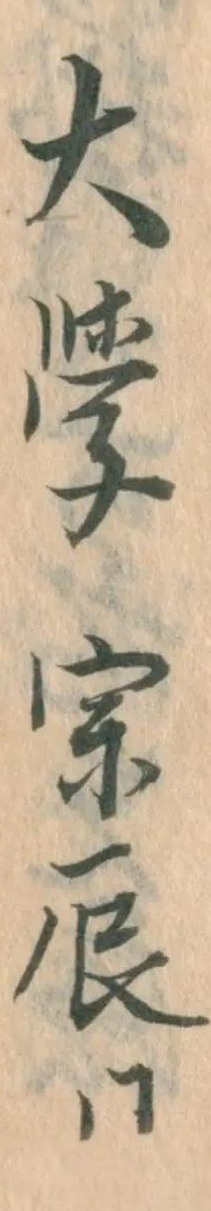大学宗辰同
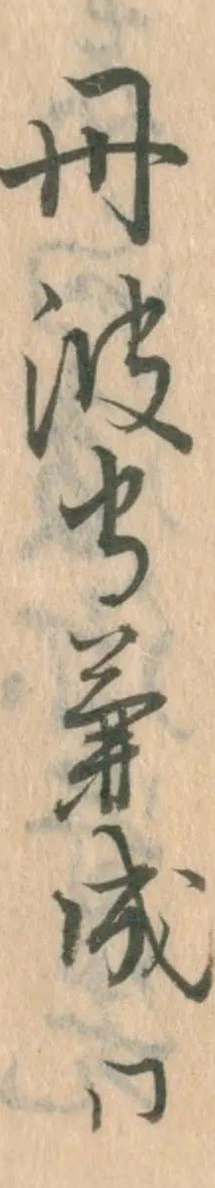丹波守兼成同
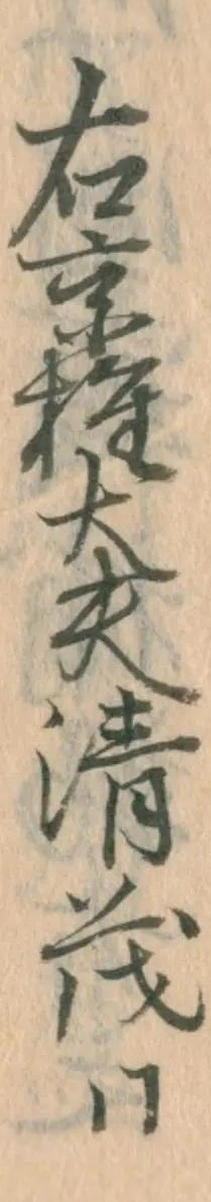右京権大夫清茂同
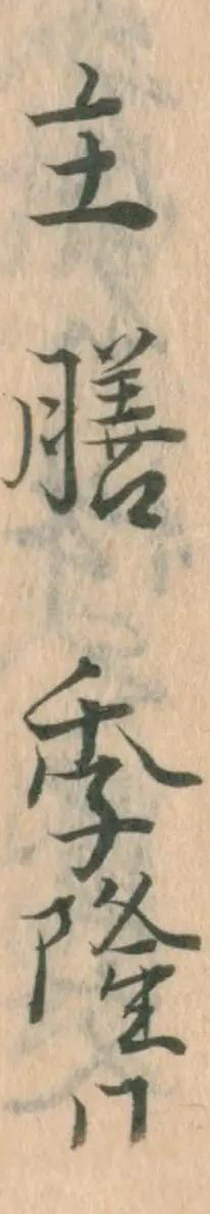主膳季隆同
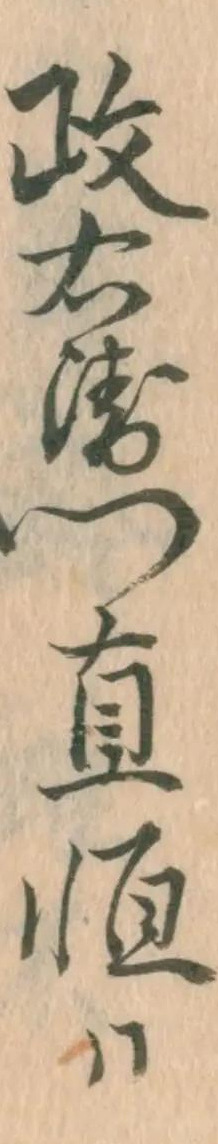政右衛門直恒同
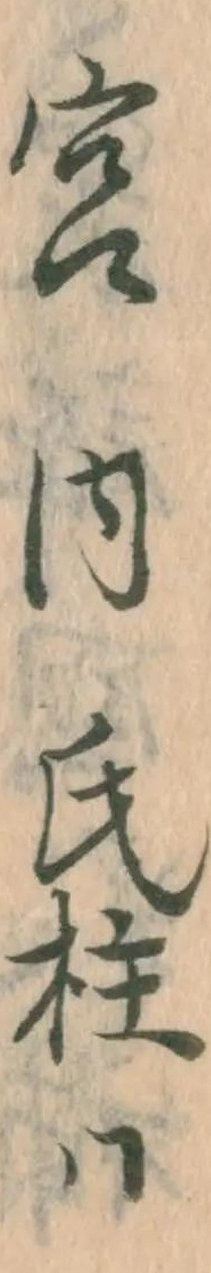宮内氏柱同
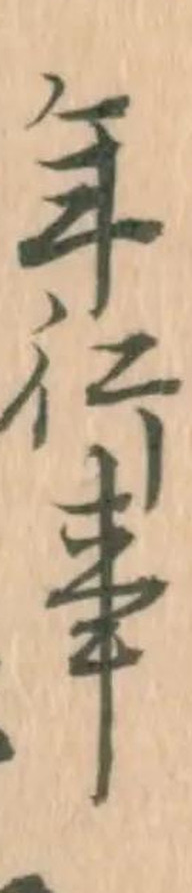年行事
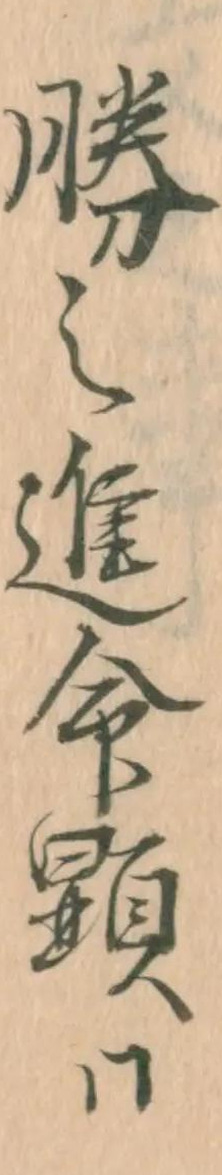勝之進命顕同
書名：賀茂社記録. 第39冊
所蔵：国立国会図書館 National Diet Library, JAPAN
